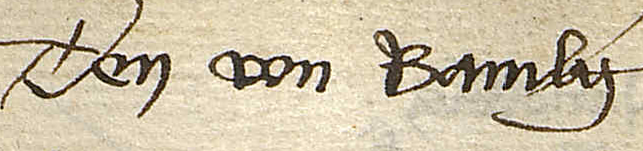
Den von Bamb*g
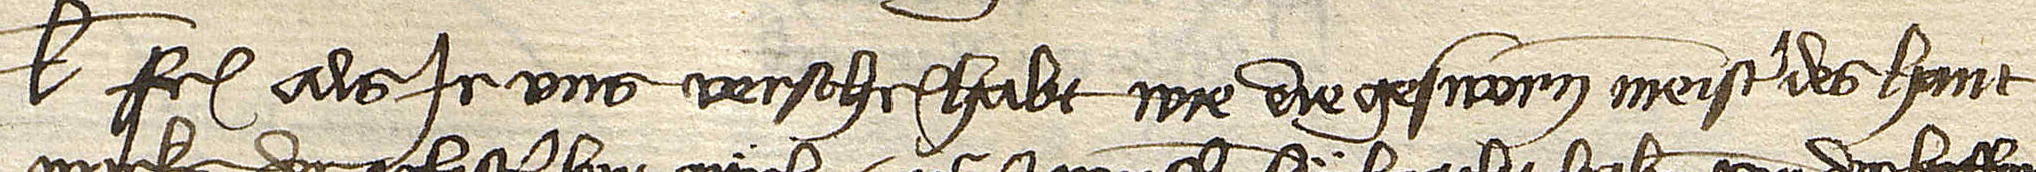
L* fr* als Ir vns verſchr* habt wie die geſworn* meiſt* des hant
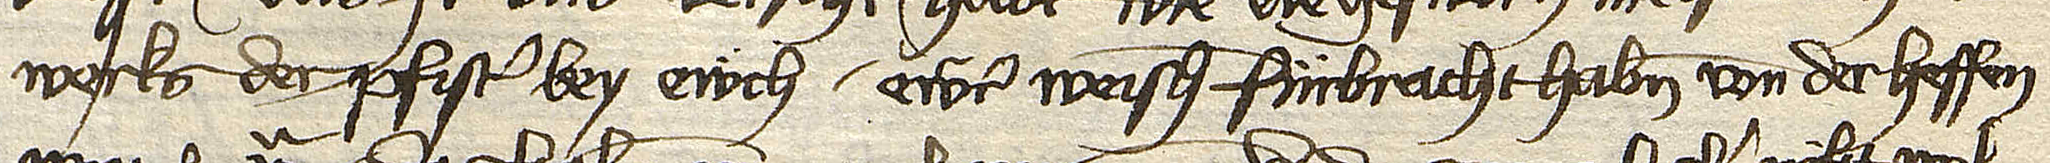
werks der Pfiſt* bey eẅch / eẅr* weiſh* fürbracht habn* von der heffen
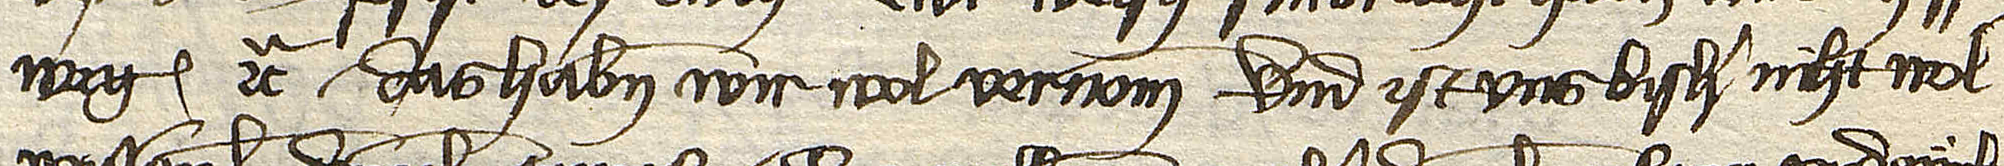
weg* ec* / das habn* wir wol vernom* Vnd iſt vns biſh* niht wol
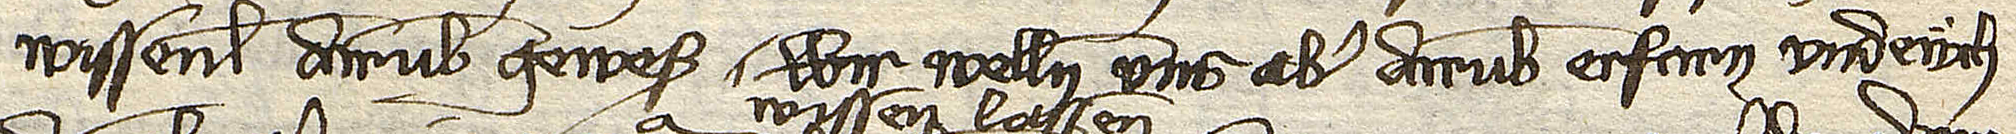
wiſſenl* darub* geweſ* / Wir welln* vns ab* darub* erfarn vnd eẅch
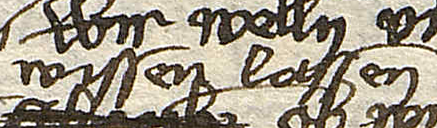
wiſſen laſſen
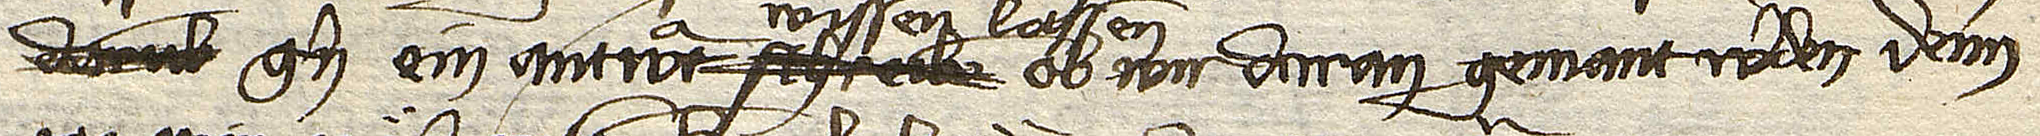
darub* g*n ein antw*t ſchreibe* ob wir daran gemant w*den denn
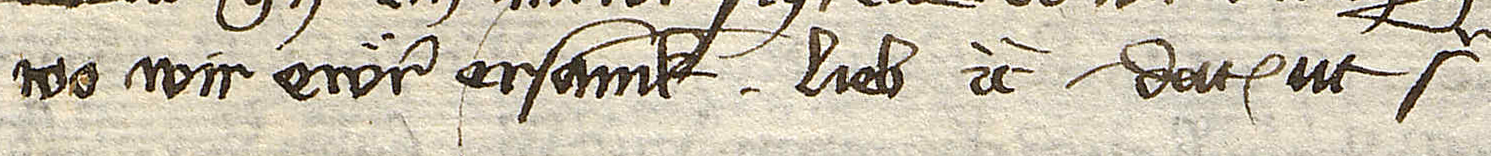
wo wir eẅr* erſamk* . lieb ec* / dat* ut ſ*
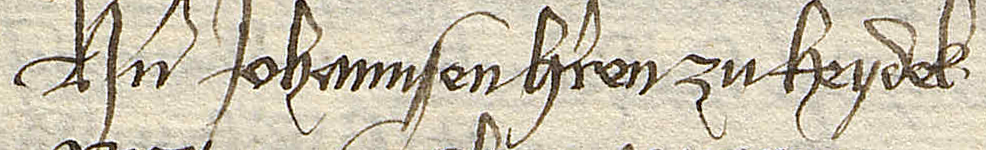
Hn* Iohannſen h*ren ʒu Heydek
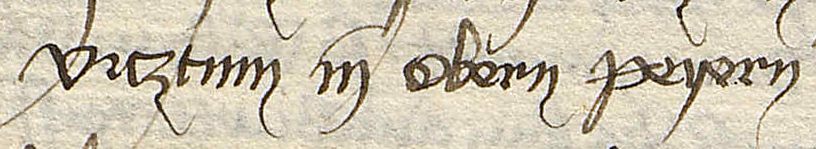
vicʒtum in Obern Peyern
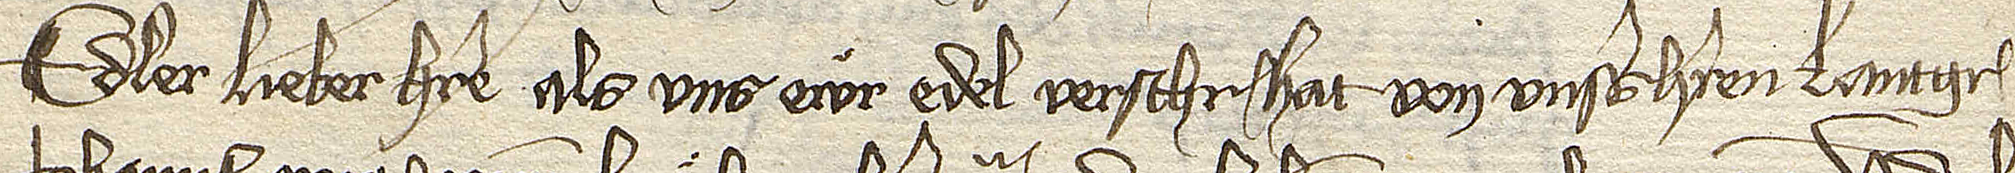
Edler lieber h*re als vns eẅr edel verſchr* hat von vnſ*s h*ren Lantgr*
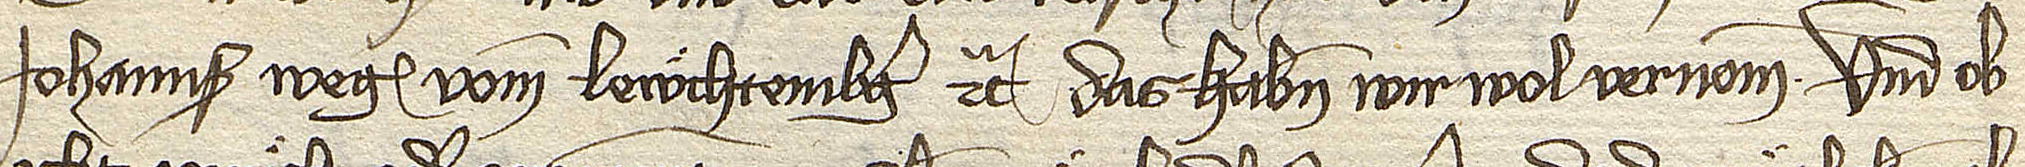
Iohannſ* weg* vom* leẅchtenb*g ec* das habn* wir wol vernom* . Vnd ob
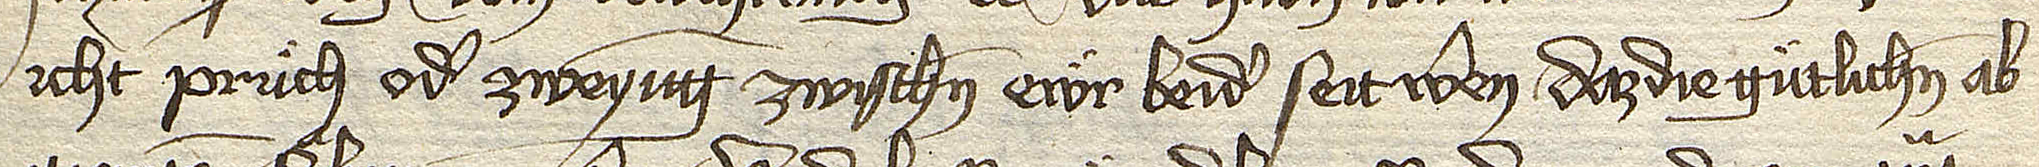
icht prüch od* ʒweyu*g ʒwiſchn* eẅr beid* ſeit w*en / daʒ die gütlichn* ab
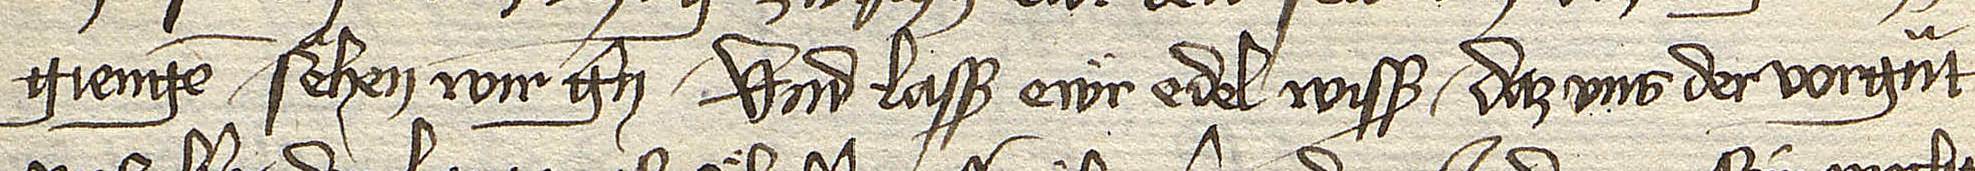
gienge* / ſehen wir g*n / Vnd laſſ* eẅr edel wiſſ* / daʒ vns der vorgnt*
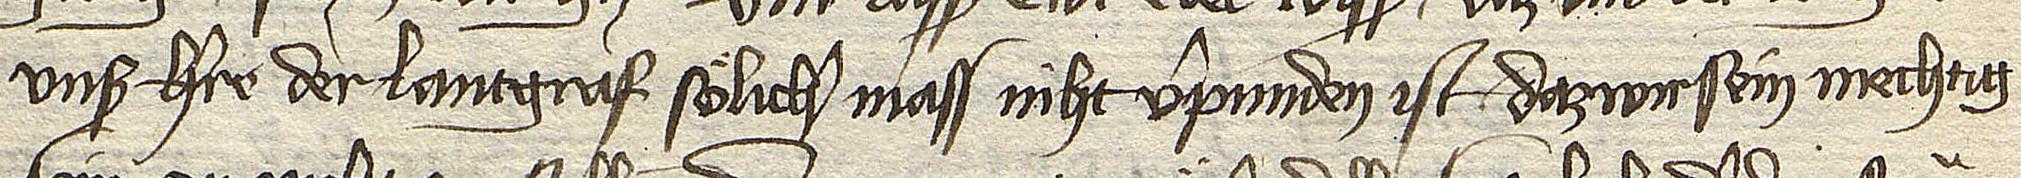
vnſ* h*re der lantgraf ſölich* maſſ niht v*punden iſt / daʒ wir ſein mechtig
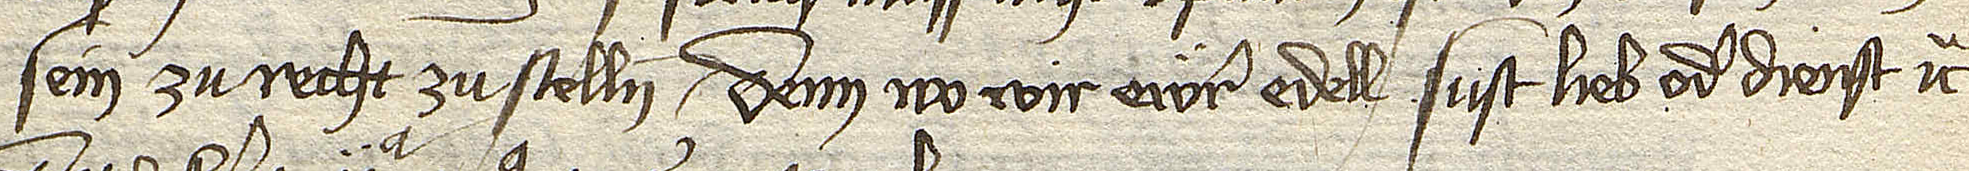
ſein ʒu recht ʒu ſtelln* / Denn wo wir eẅr* edell ſuſt lieb od* dienſt ec*
